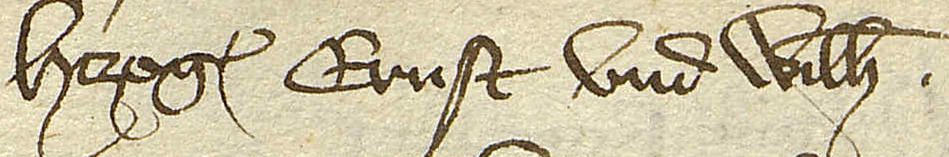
H*cʒog* Ernſt vnd Wilh* .
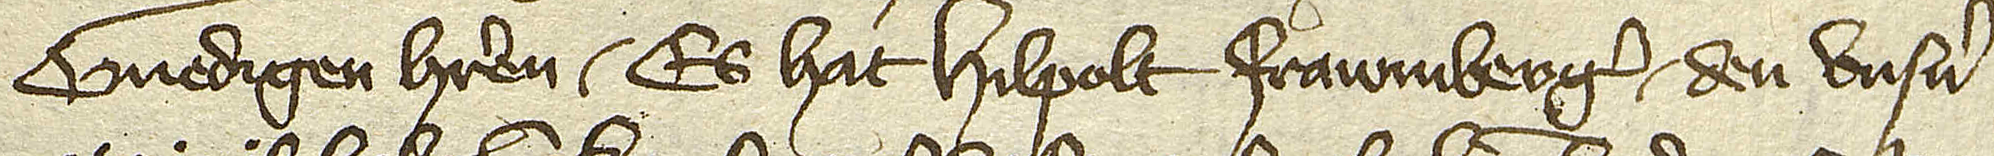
Gnedigen hr*en / Es hat Hilpolt Frawmberg* / den vnſn*
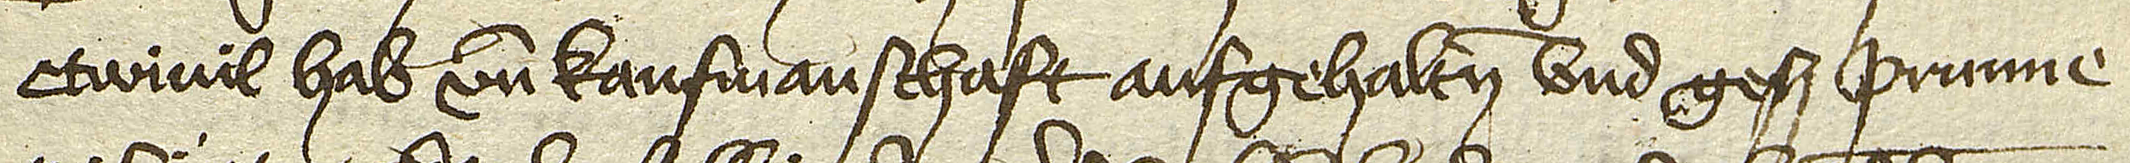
etwiuil hab vn* kaufmanſchaft aufgehaltn* vnd gen Prunne
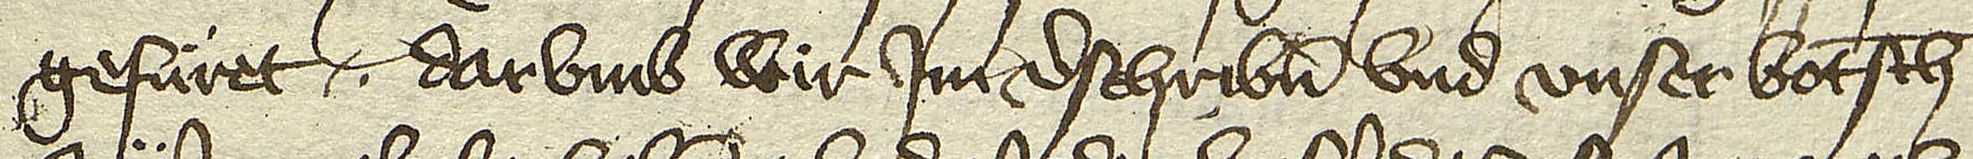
gefüret / . darvmb wir Im v*ſchribn* vnd vnſer botſch*
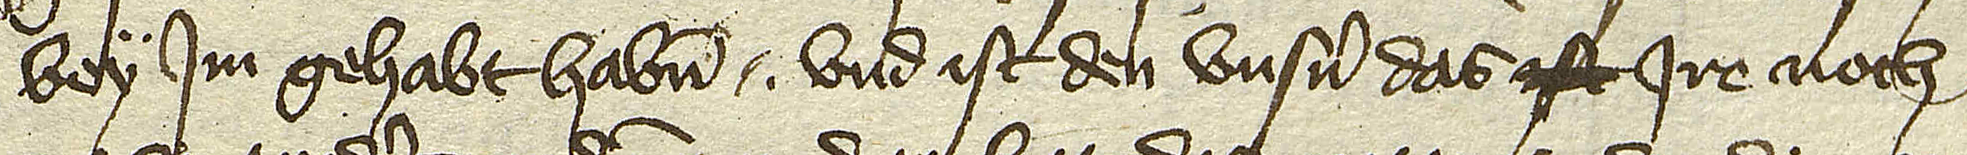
bey Im gehabt habn* / . vnd iſt den vnſn* das iſt Ire noch
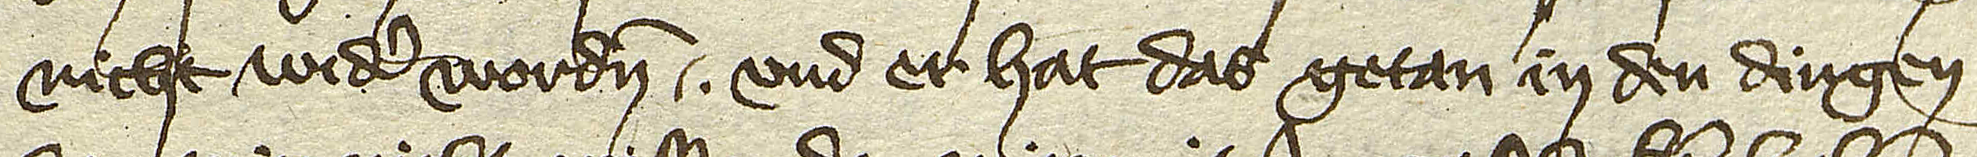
nicht wid* wordn* / . vnd er hat das getan in den dingen
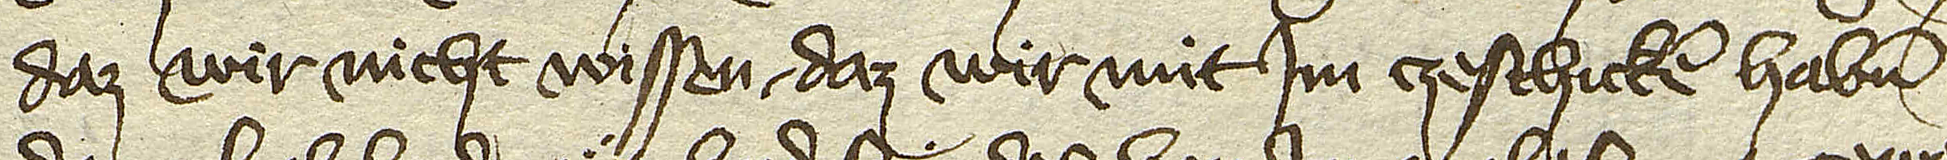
daʒ wir nicht wiſſen / daʒ wir mit Im cʒeſchicke* habn*
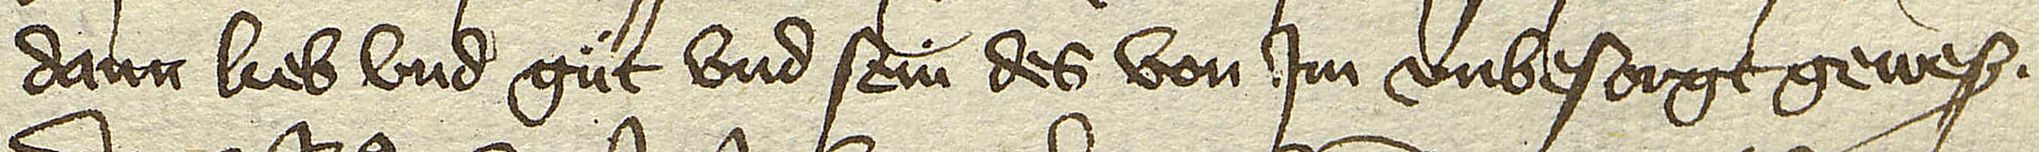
dann lieb vnd güt vnd ſein des von Im vnbeſorgt geweſ* .
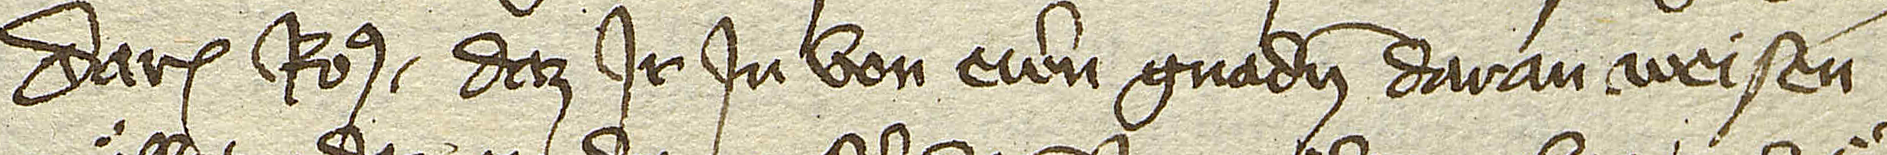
Dar* Ro* / daʒ Ir In von ew*n gnadn* daran weiſen
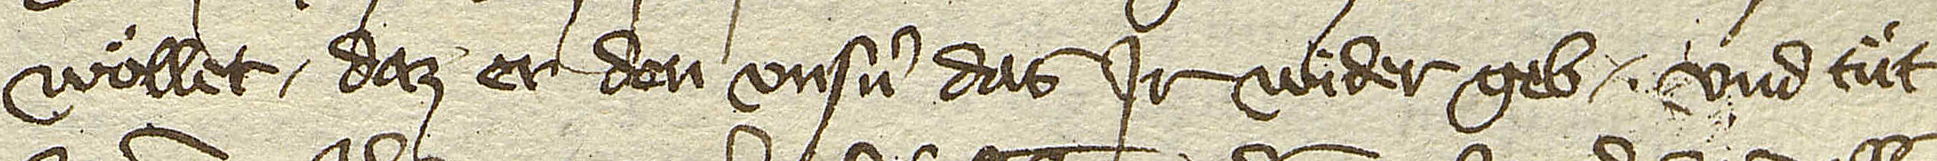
wöllet / daʒ er den vnſn* das Ir wider geb / . vnd tüt
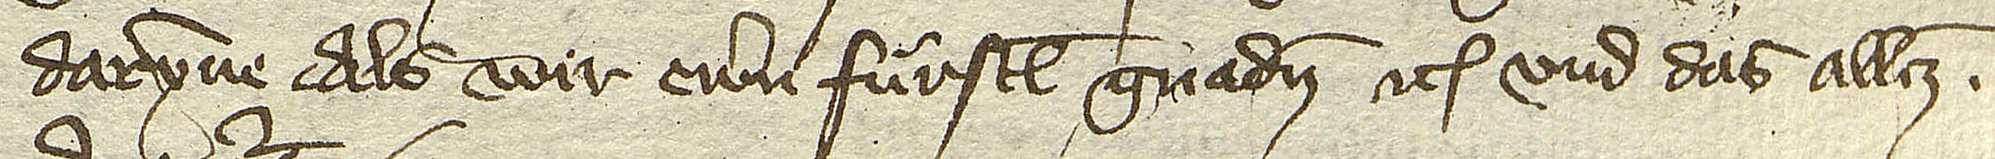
daryne* / Als wir ew*n fürſtl* gnadn* ec* vnd das allcʒ*
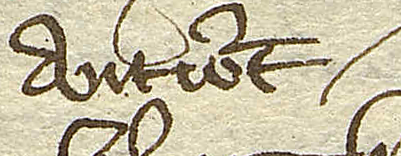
Antwt* /
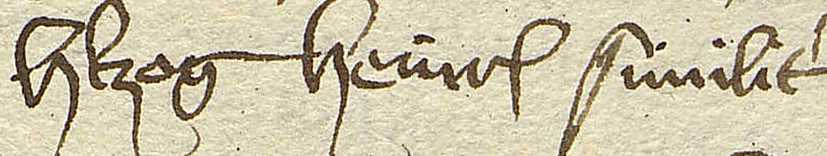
H*cʒog Heinr* ſimilit*
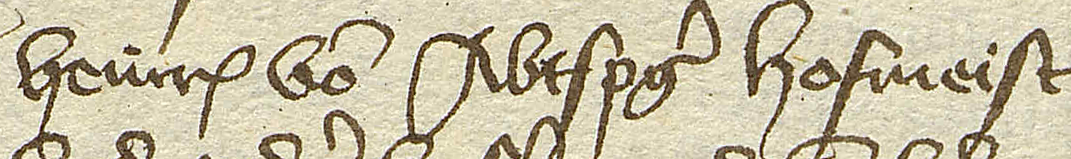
heinr* vo* Abtſpg* hofmeiſt*
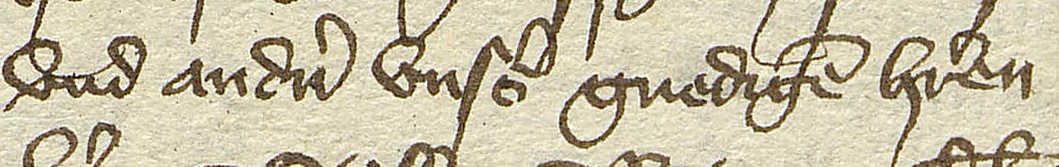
vnd andn* vnſs* gnedige* hr*en
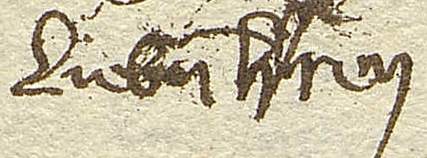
Liebn* h*ren
